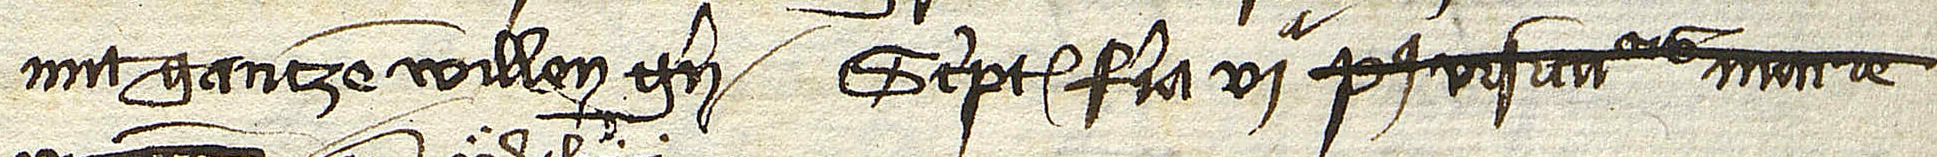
mit gancʒe* willen g*n / Sc*pt* fia* vi* p* viſita* marie
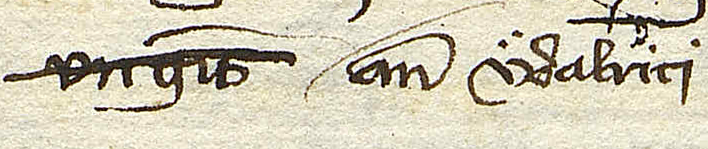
virgi*is / an* v̈dalrici
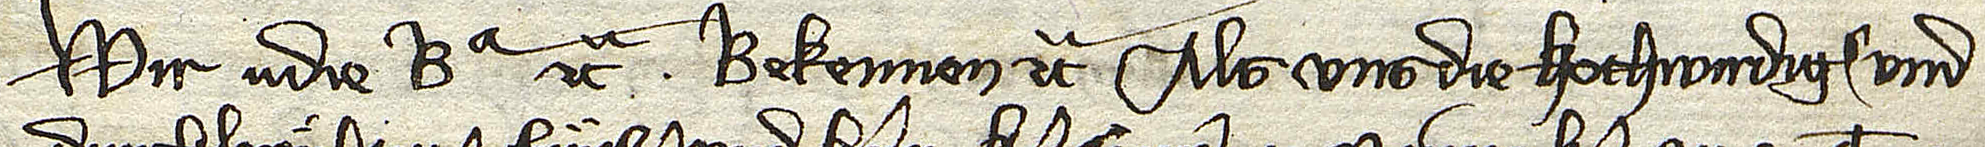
Wir ~ die B* ec* . Bekennen ec* Als vns die hochwirdig* vnd
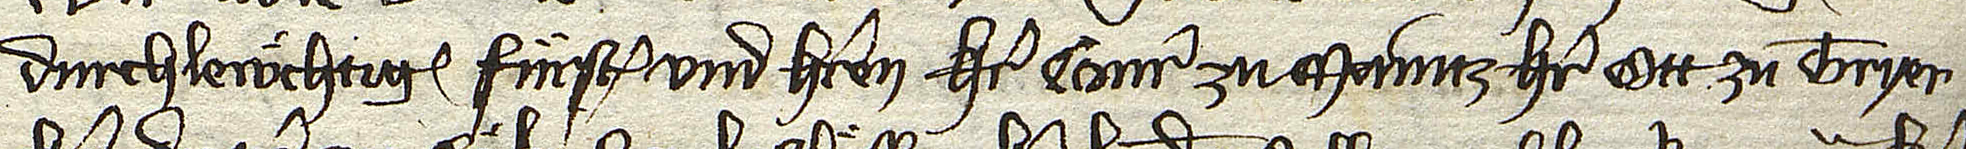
durchlewchtig* fürſt* vnd h*ren h*r Conr* ʒu Maincʒ h*r Ott ʒu Tryer
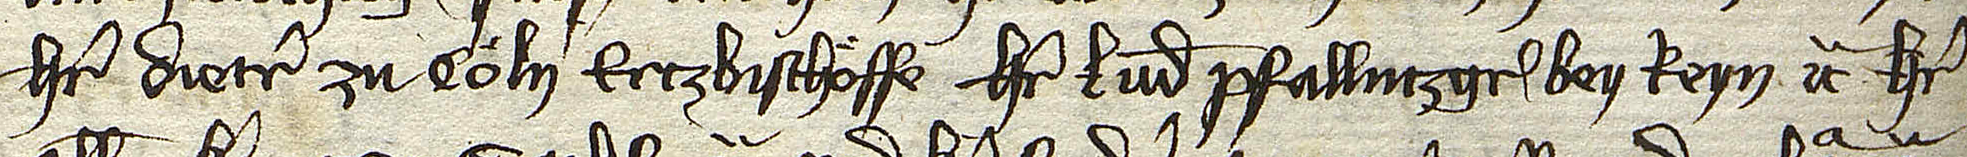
h*r dietr* ʒu Cöln Ercʒbiſchöffe h*r lud* pfallncʒgr* bey Reyn ec* h*r
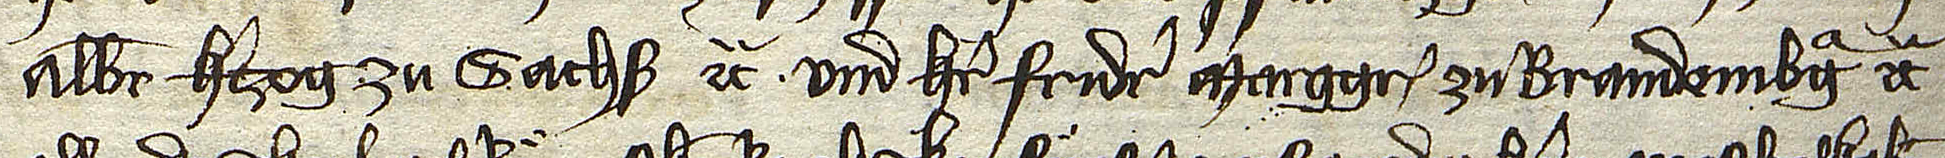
albr* hcʒog* ʒu Sachſ* ec* vnd h*r fridr* Marggr* ʒu Brandemb*g ec*
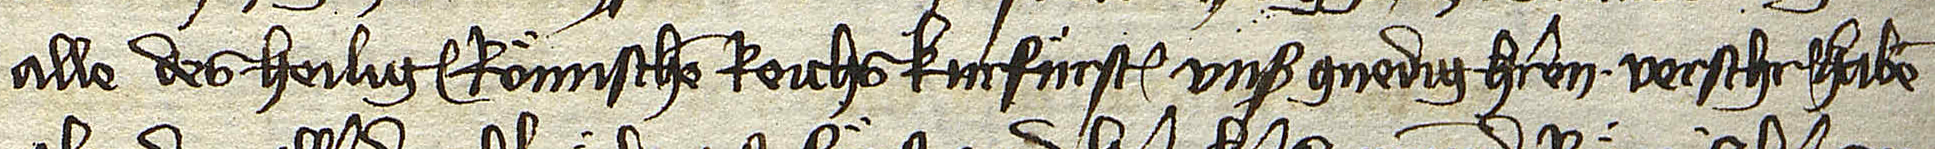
alle des heilig* Römiſche* Reichs kurfürſt* vnſ* gnedig h*ren . verſchr* habe*
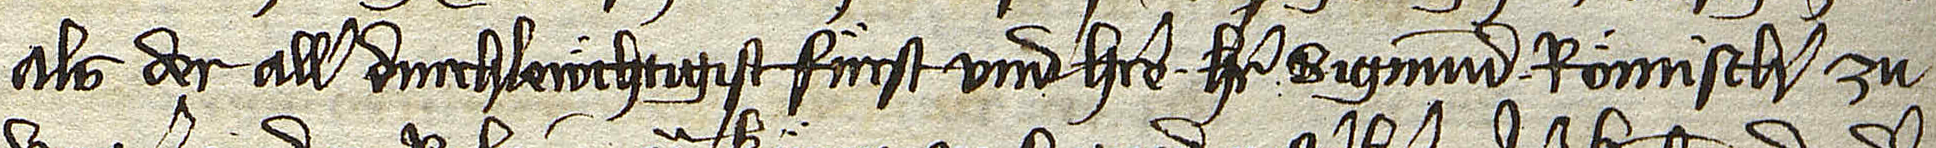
als der all* durchlewchtigiſt fürſt vnd h*re ~ h*r Sigmu*d . Römiſch* ʒu
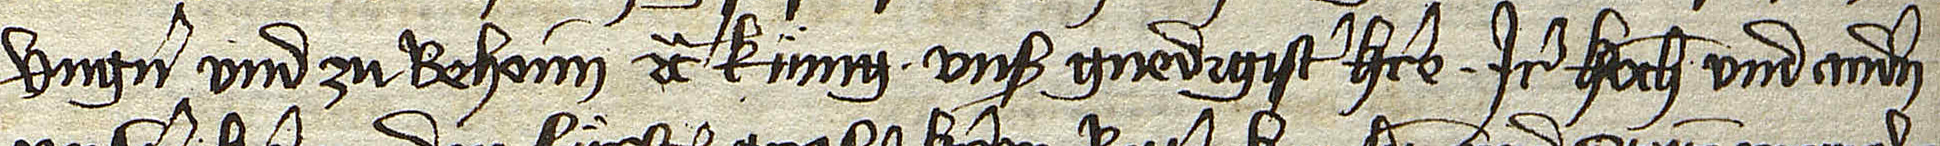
Vng*n vnd ʒu Beheim ec* künig . vnſ* gnedigiſt* h*re . Ir* hoch* vnd and*n
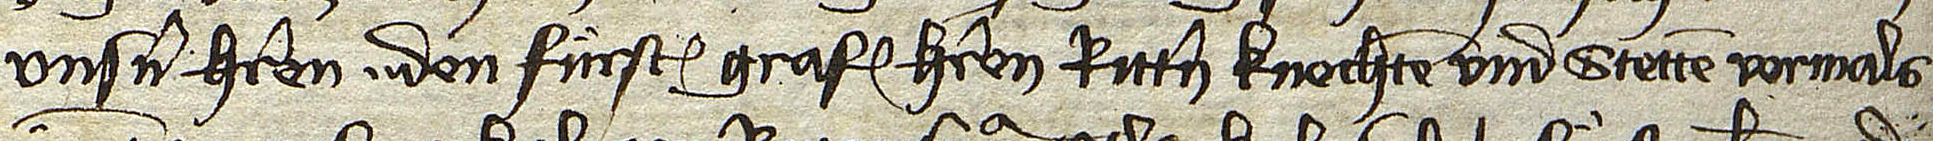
vnſ*n h*ren ~ den fürſt* graf* h*ren Ritt*n knechte* vnd Stette* vormals
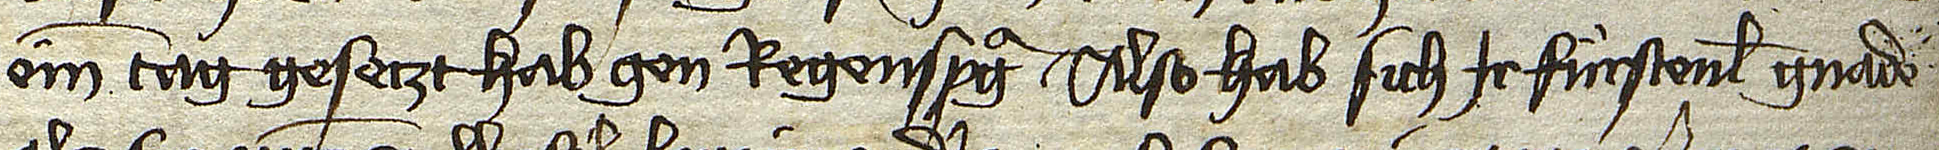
ein* tag geſecʒt hab gen Regenſp*g / Alſo hab ſich Ir fürſtenl* gnade
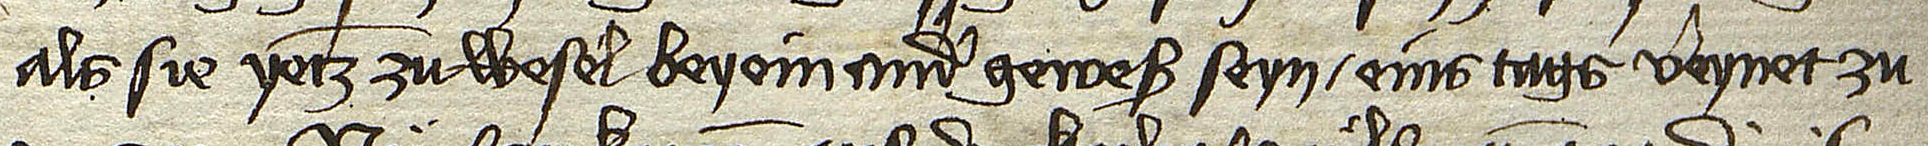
als ſie yecʒ* ʒu Weſel beyein and* geweſ* ſeyn / eins tags v*eynet ʒu
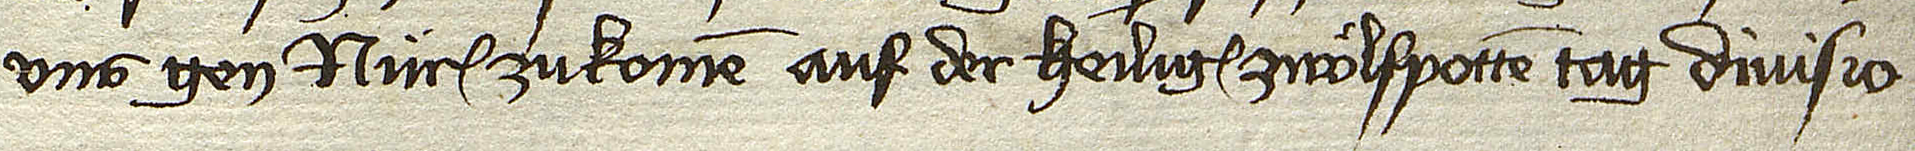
vns gen Nür* ʒu kome* auf der heilig* ʒwölfpotte* tag diuiſio
